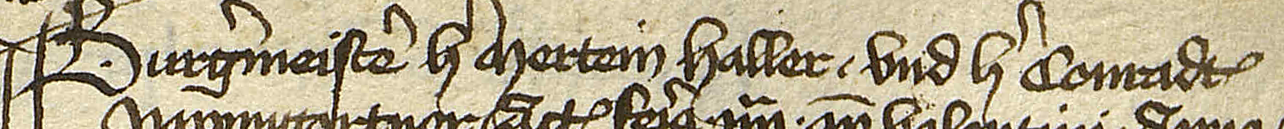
Burg*meiſte* h* Mertein haller / vnd h* Conradt*
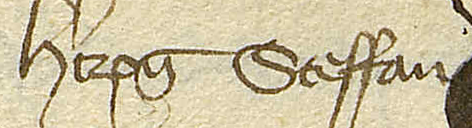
h*cʒog Steffan
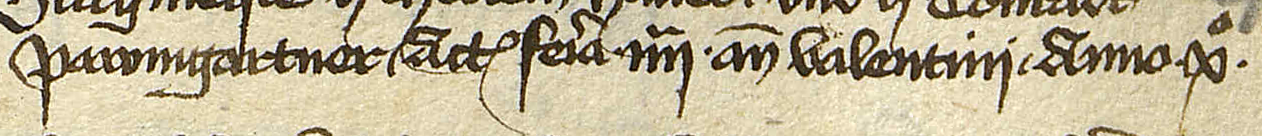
Pawmgartner / Act* feia* iiii* an* valentini / Anno . x* .
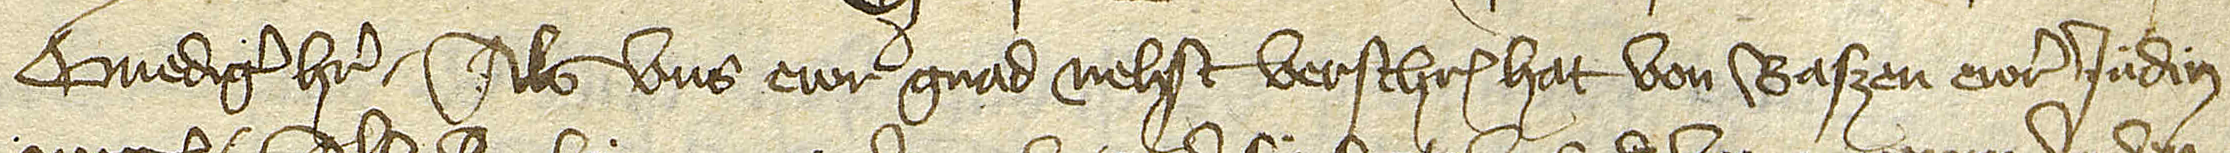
Gnedig* hr* / Als vns ewr gnad nehſt verſchr* hat von Baſʒen ewr* Iüdin
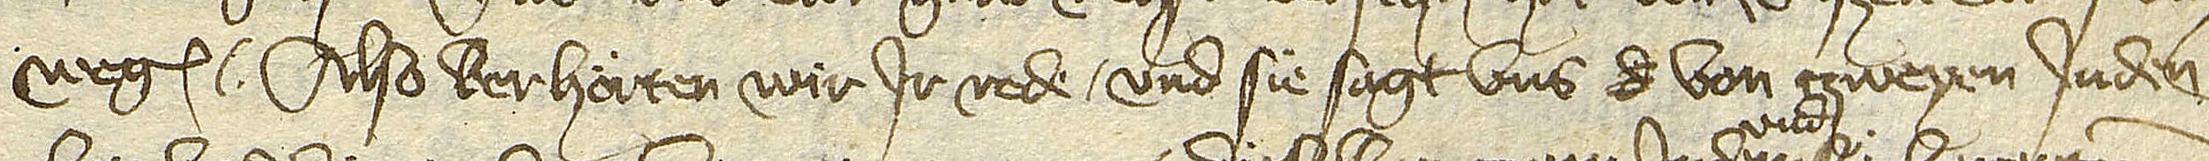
weg* /. Alſo verhörten wir Ir rede / vnd ſie ſagt vns d von cʒweyen Iuden
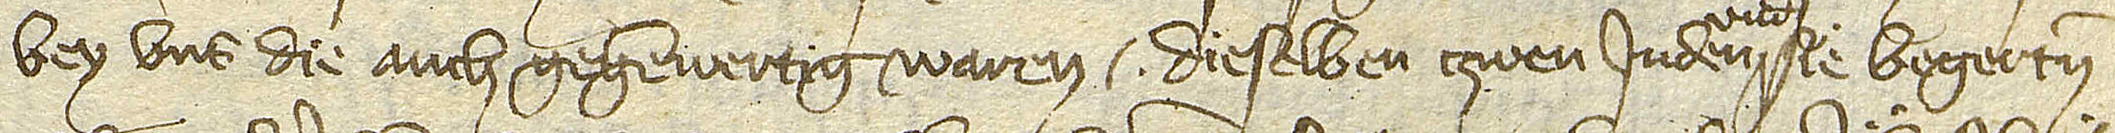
bey vns die auch gege*wertig waren / . dieſelben cʒwen Iuden ſie begertn*
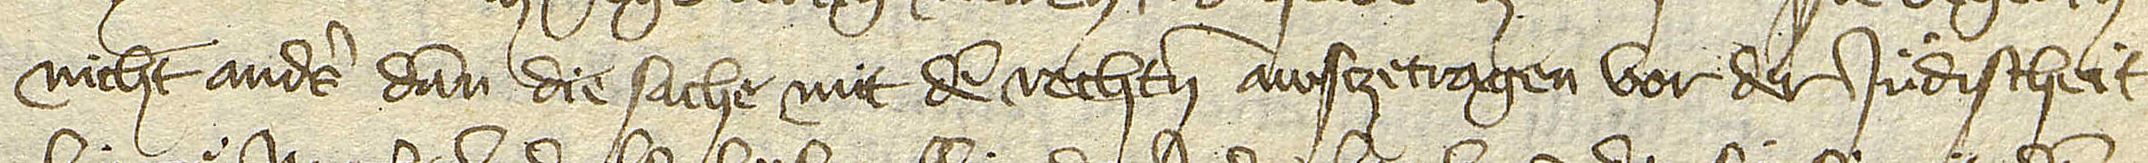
nicht ands* dan* die ſache mit d* rechtn* awſcʒetragen vor der Iüdiſcheit
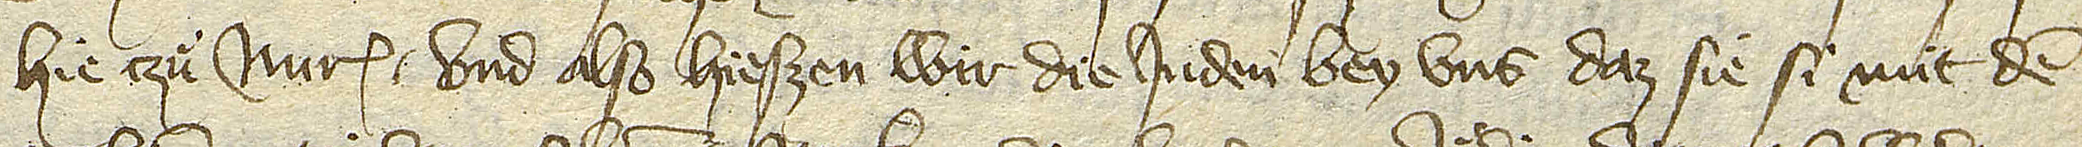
hie cʒü Nur* / vnd alſo hieſʒen wir die Iuden bey vns daʒ ſie ſi mit d*
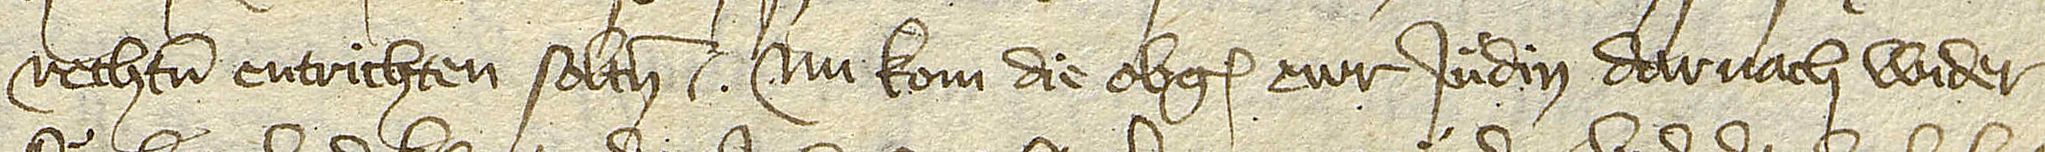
rechtn* entrichten ſoltn* / . Nu kom die obg* ewr Iüdin darnach wider
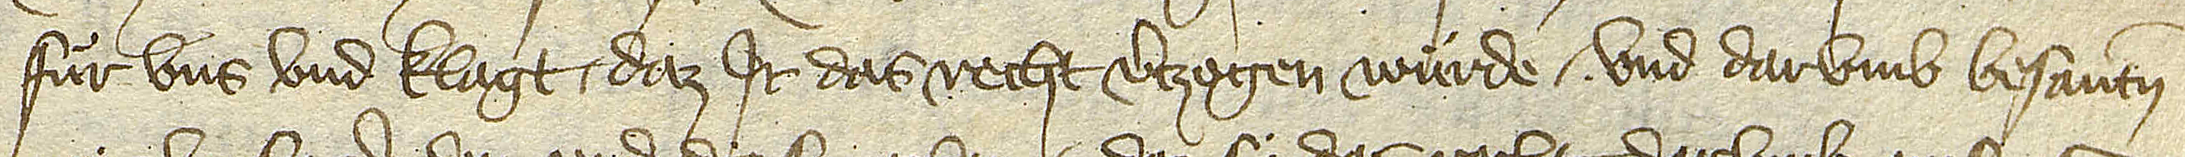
für vns vnd klagt / daʒ Ir das recht v*cʒogen würde / . vnd darvmb beſantn*
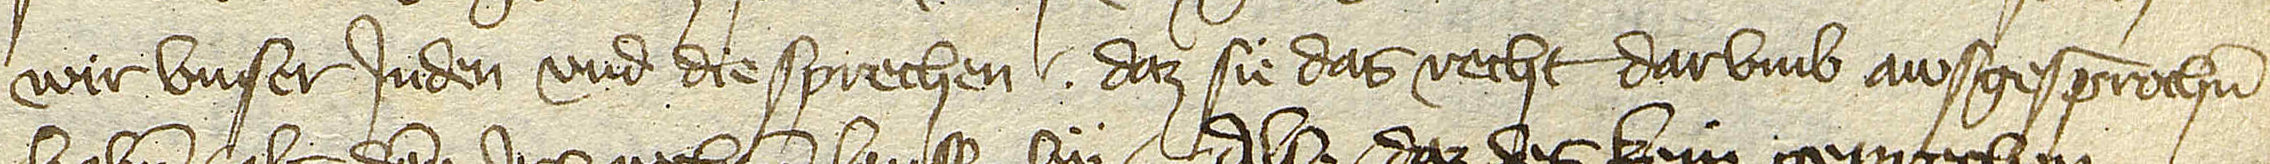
wir vnſer Iuden vnd die ſprechen / . daʒ ſie das recht darvmb awſgeſprochn*
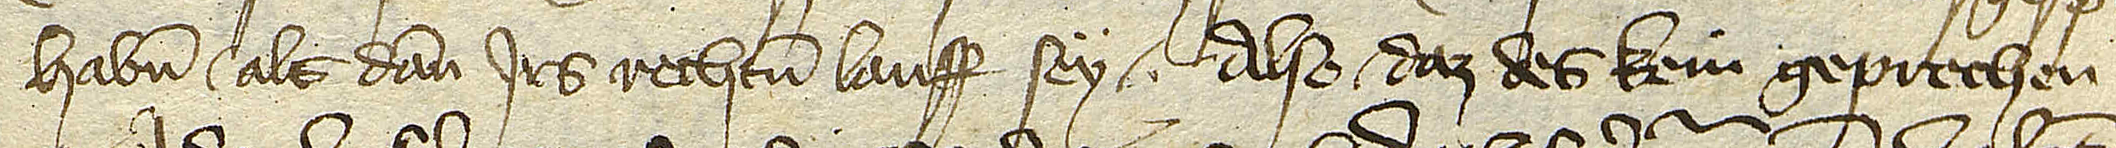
habn* / als dan* Irs rechtn* lauff ſey / . Alſo / daʒ des kein geprechen
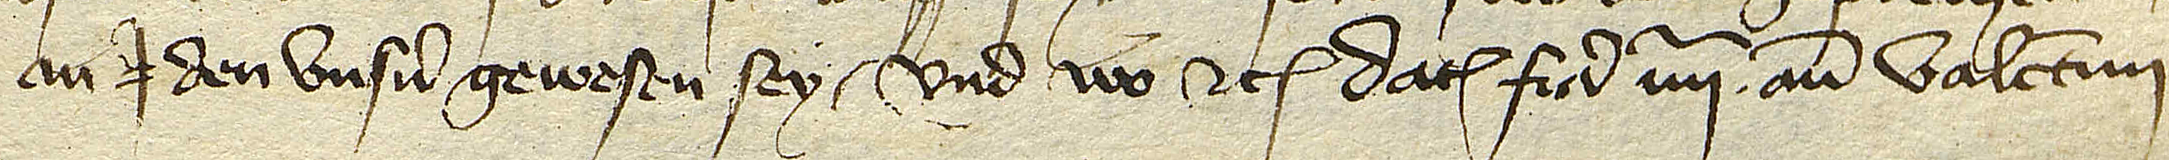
an I den vnſn* geweſen ſey / vnd wo ec* dat* fia* iiii* an* Vale*tini
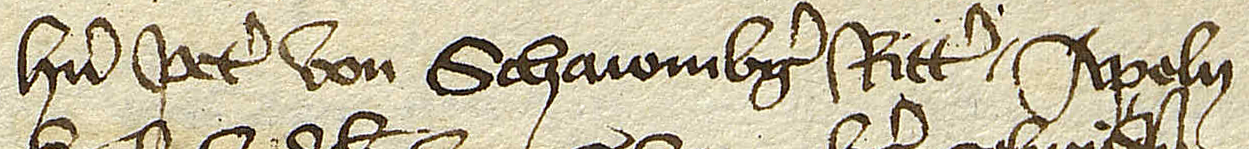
hn* pet* von Schawmbg* Ritt* / Apeln
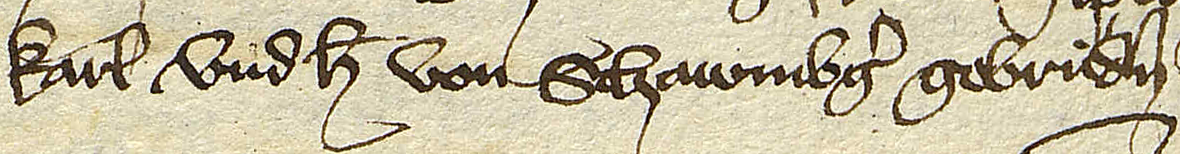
Karl / vnd h* von Schawmbg* gebrüdn*
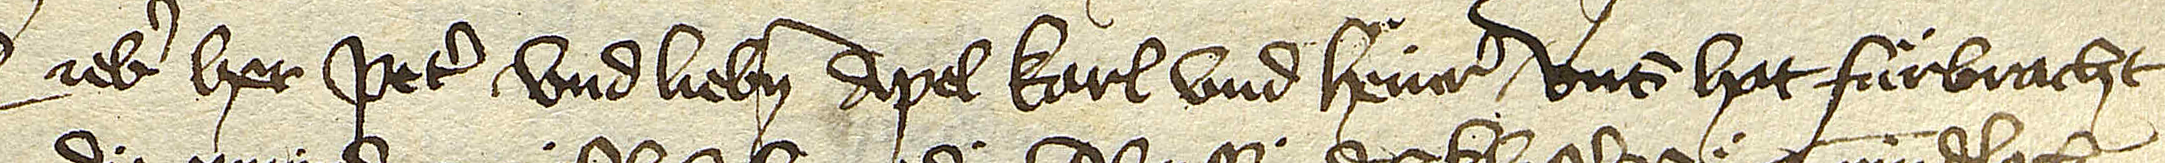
Lieb* her pet* / vnd liebn* Apel Karl vnd heinr* / Vns hat fürbracht
